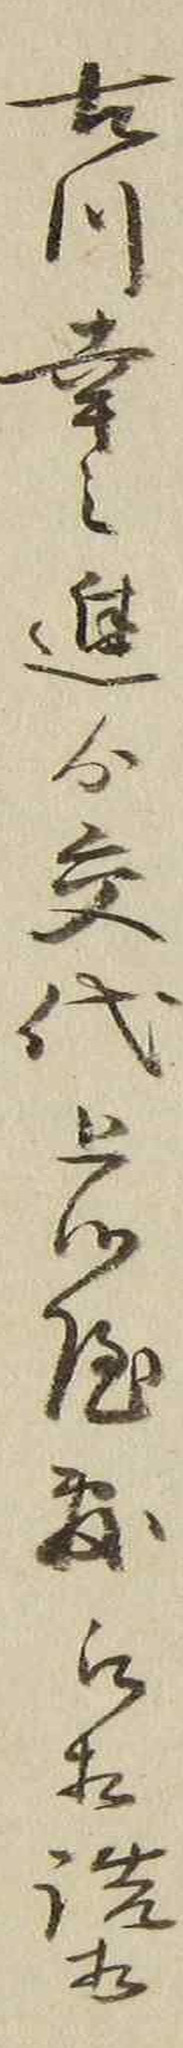古川幸之進ゟ交代上御屋敷江相詰相
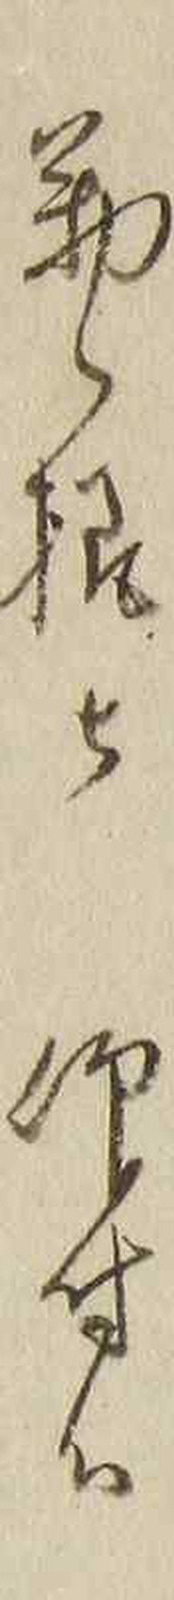勤候様被仰付候
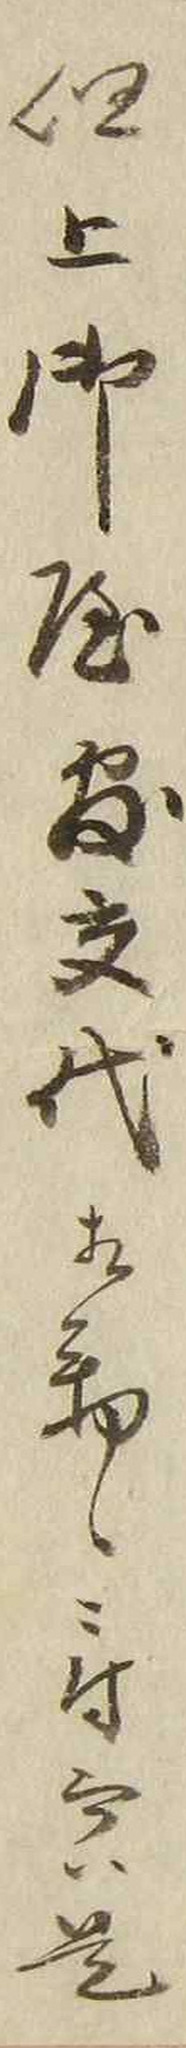但上御屋敷交代相勤候ニ付而ハ是

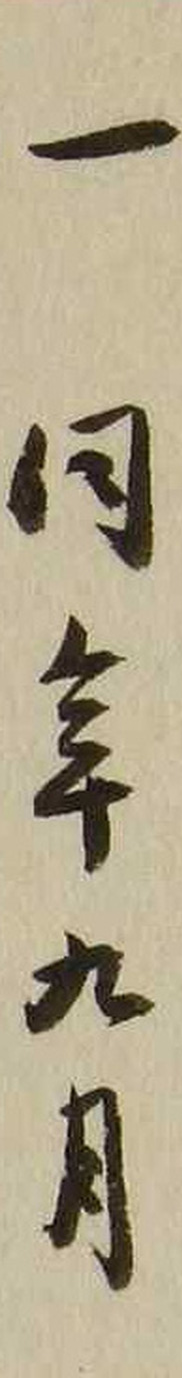一同年九月
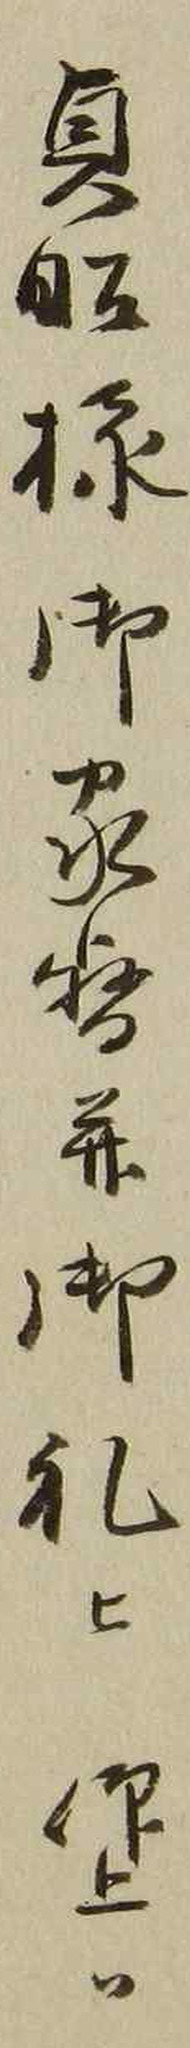真昭様御家督并御礼被仰上候
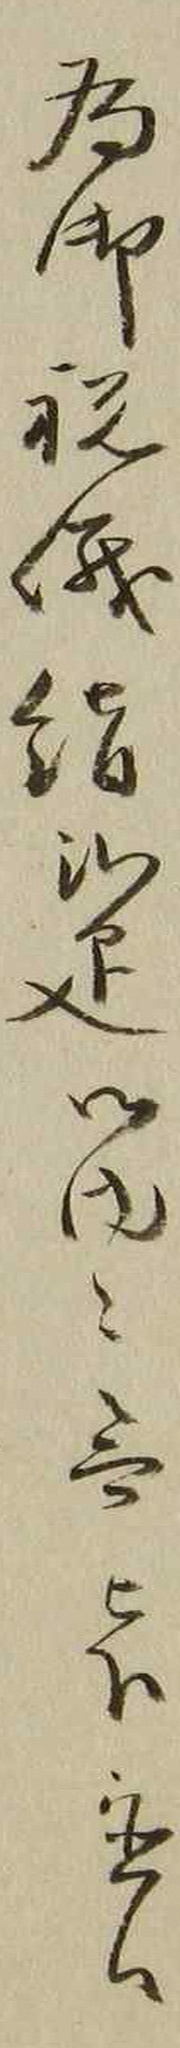為御祝儀絹弐疋御内々ニ而被下置候
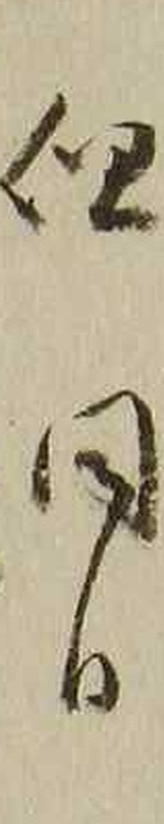但同日
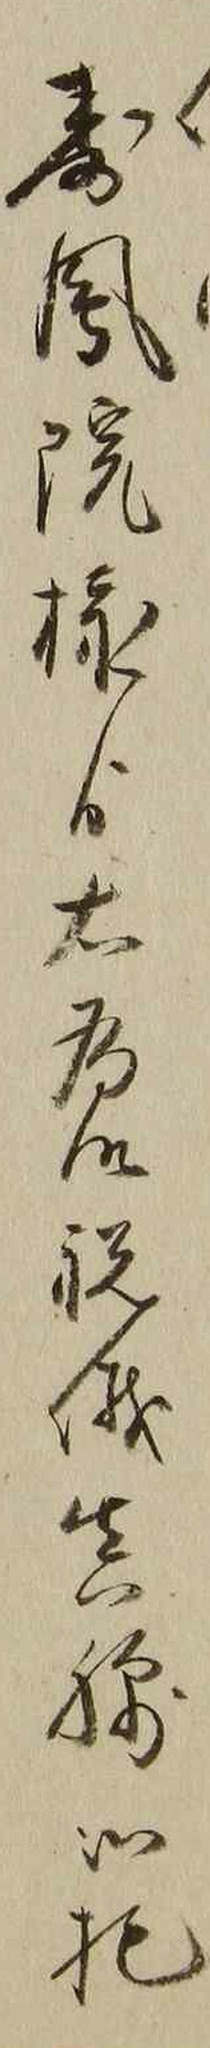寿鳳院様ゟ右為御祝儀真綿弐把
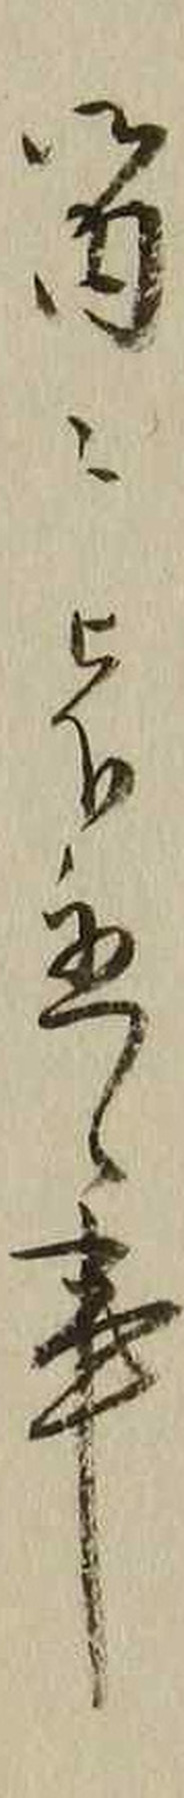御内々被下置候事
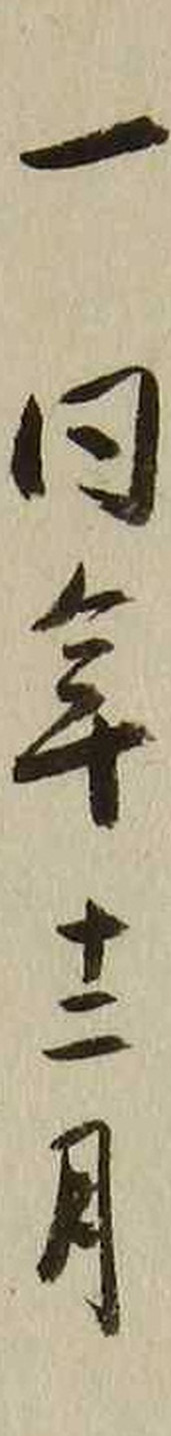一同年九月
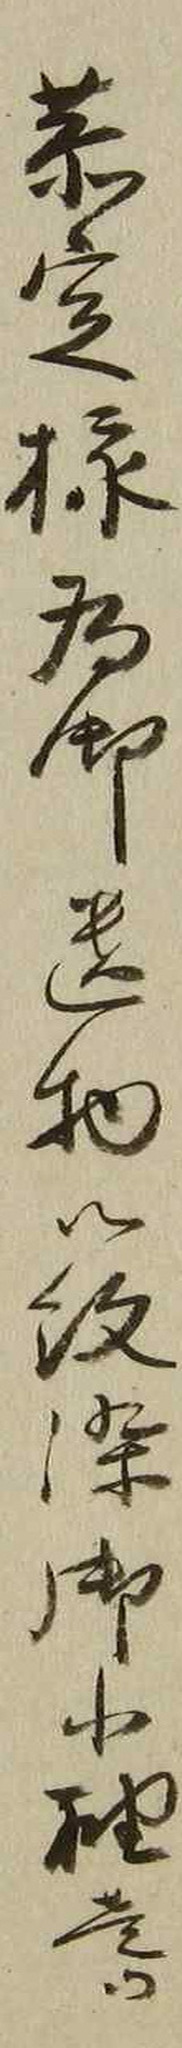恭定様為御遺物御紋染御小袖壱ツ
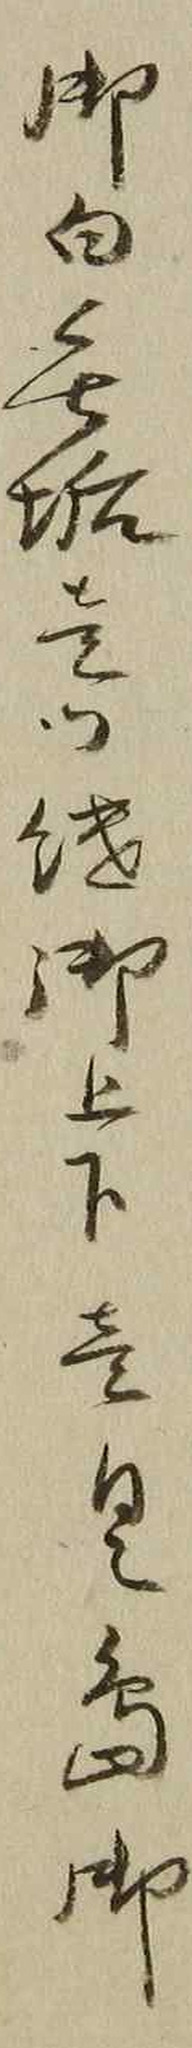御白無垢壱ツ継御上下壱具島御
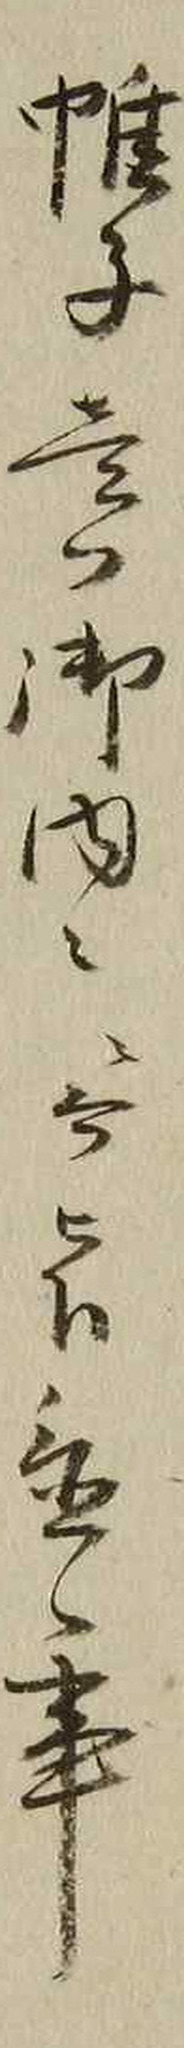帷子壱ツ内々ニ而被下置候事
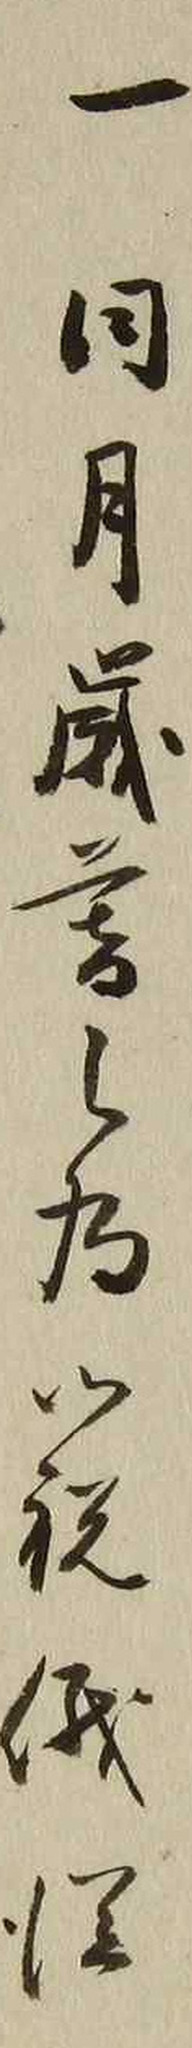一同月歳暮之為御祝儀従
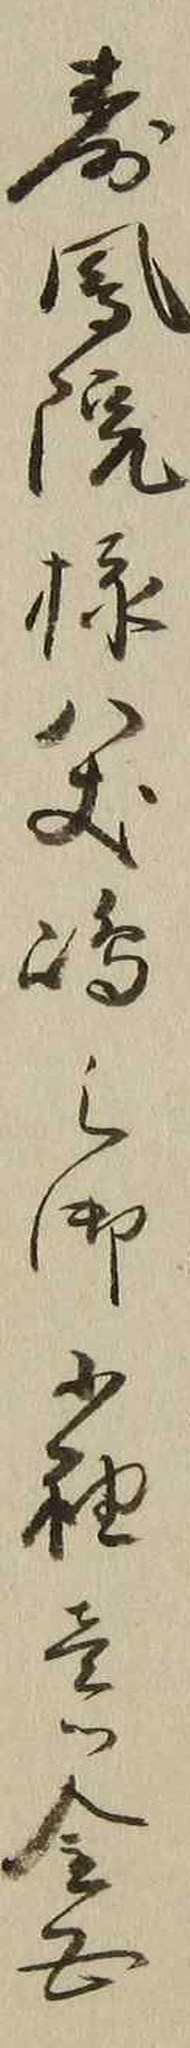寿鳳院様八丈嶋之御小袖壱ツ金五
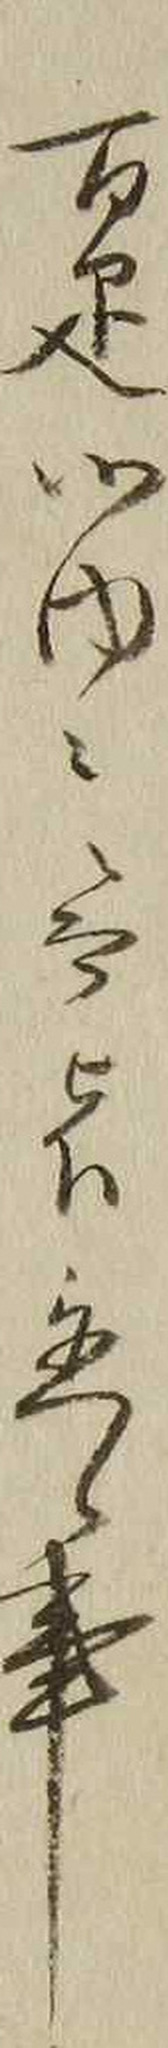百疋御内々ニ而被下置候事
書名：諸士系譜　巻之261　あ之部14
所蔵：会津若松市立会津図書館
